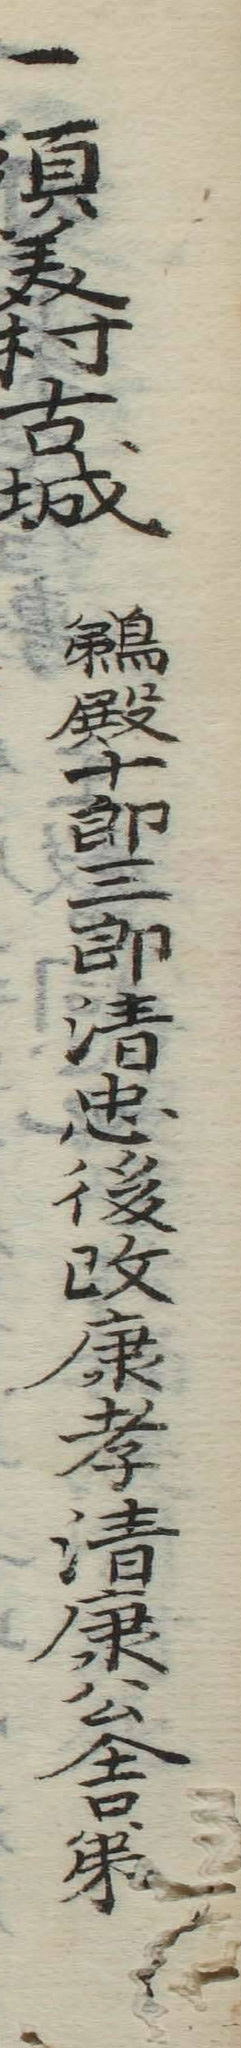一須美村古城鵜殿十郎三郎清忠後改康孝清康公舎弟
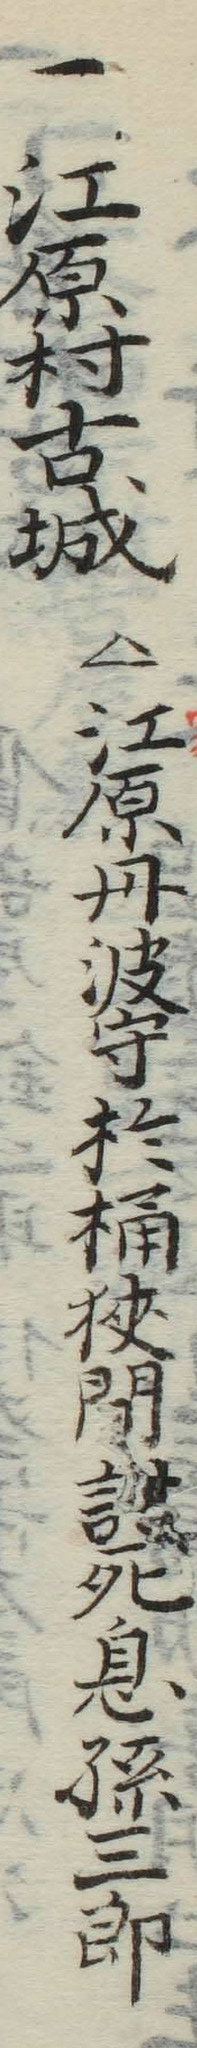一江原村古城△江原丹波守於桶狭間討死息孫三郎
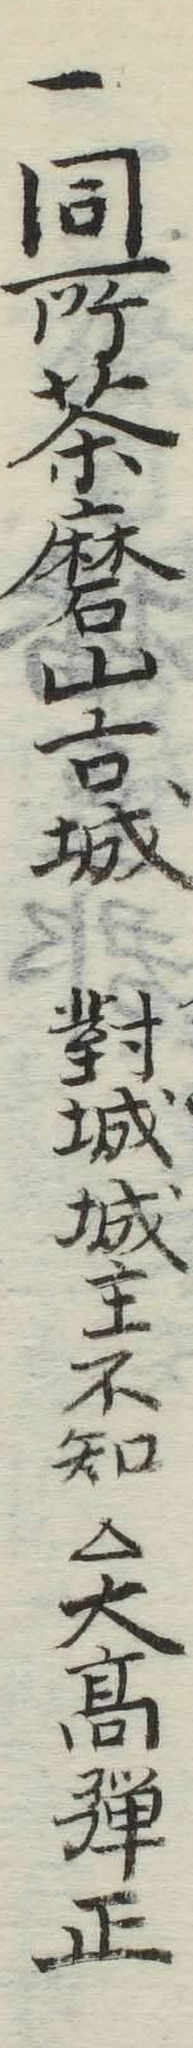一同所茶磨山古城対城城主不知△大高禅正

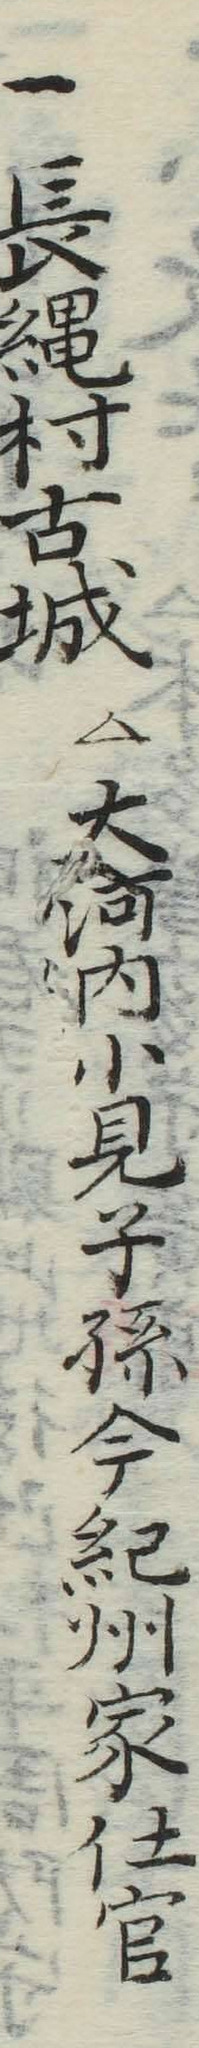一長縄村古城△大河内小見子孫今紀州家仕官
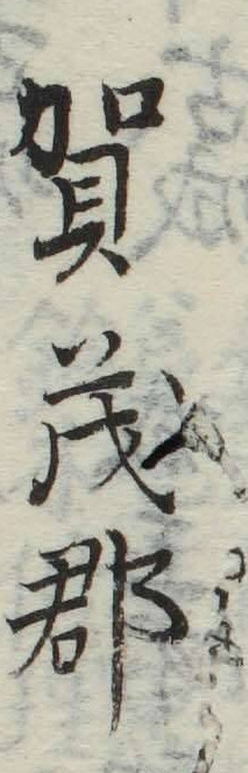賀茂郡
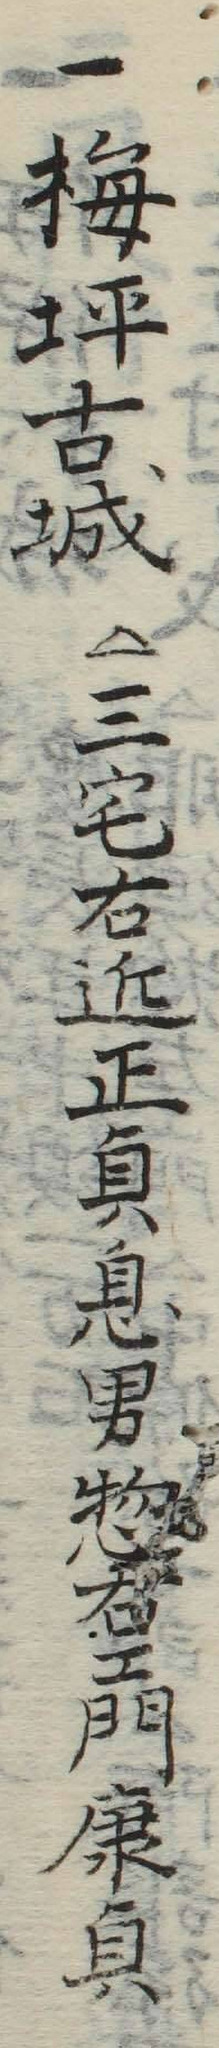一梅坪古城△三宅右近正貞息男惣右エ門康貞

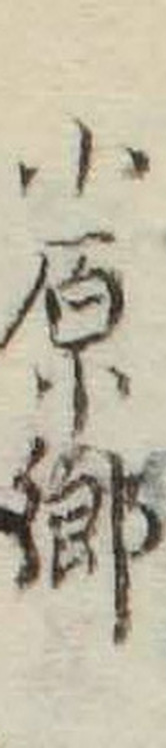小原郷

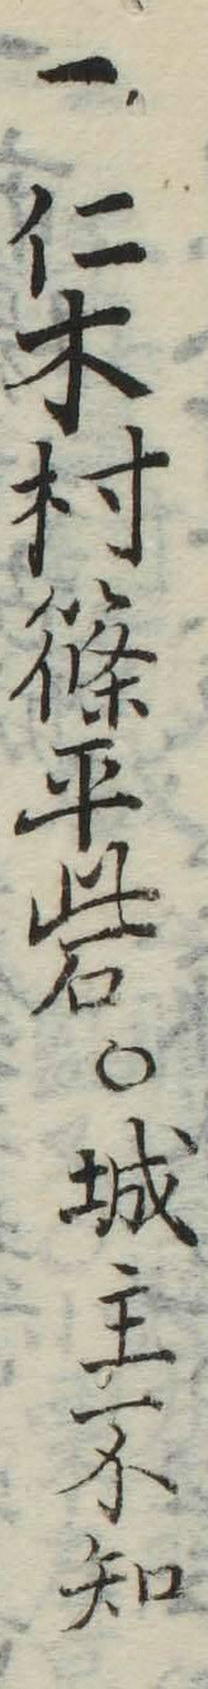一仁木村篠平砦○城主不知
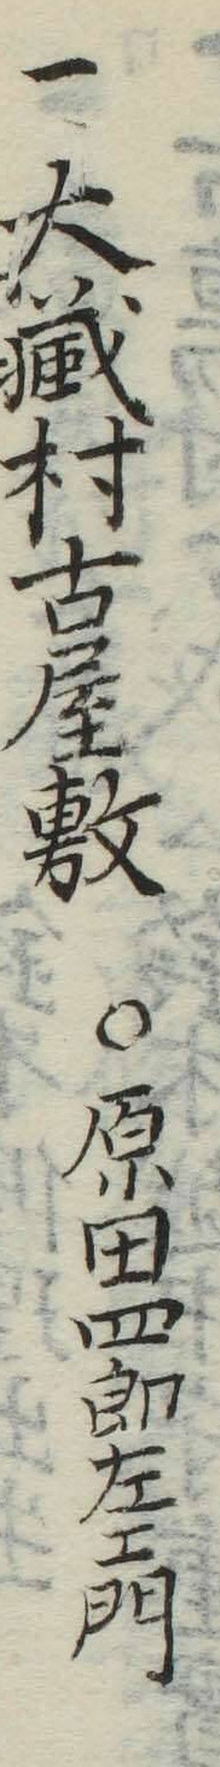一大蔵村古屋敷○原田四郎左エ門
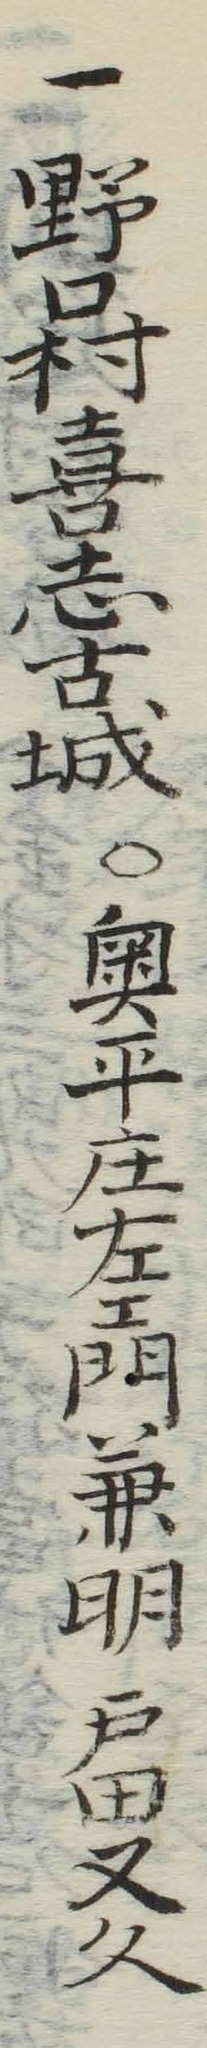一野口村喜志古城○奥平庄左エ門兼明戸田又久
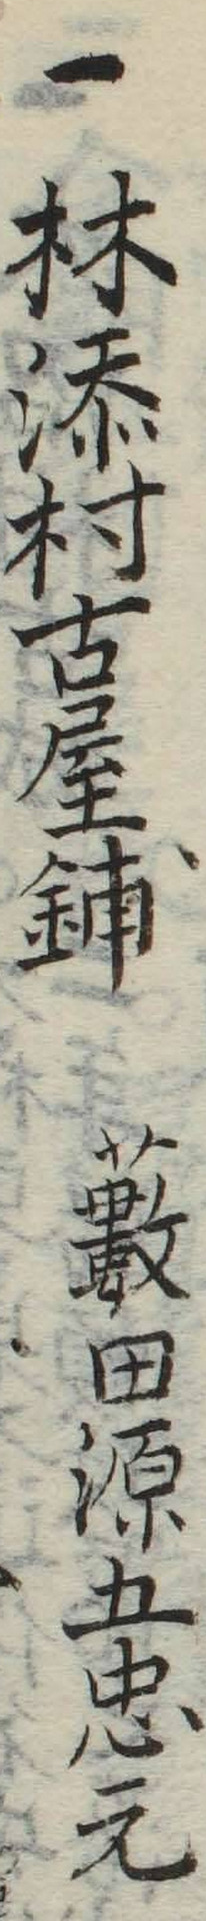一林添村古屋鋪薮田源五忠元

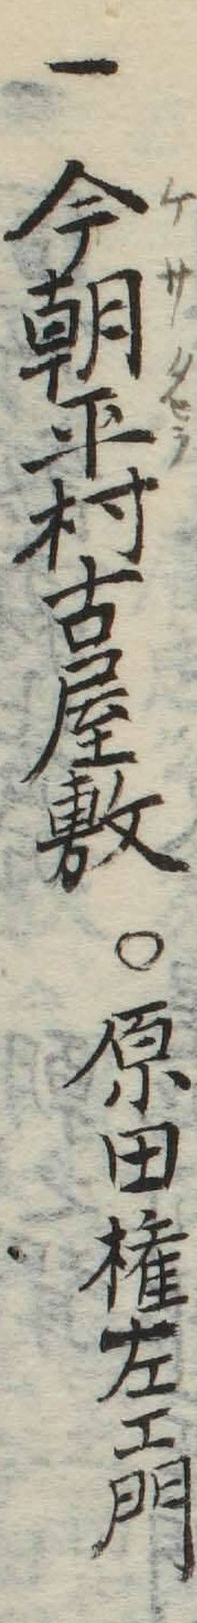一今朝平村古屋敷○原田権左衛門
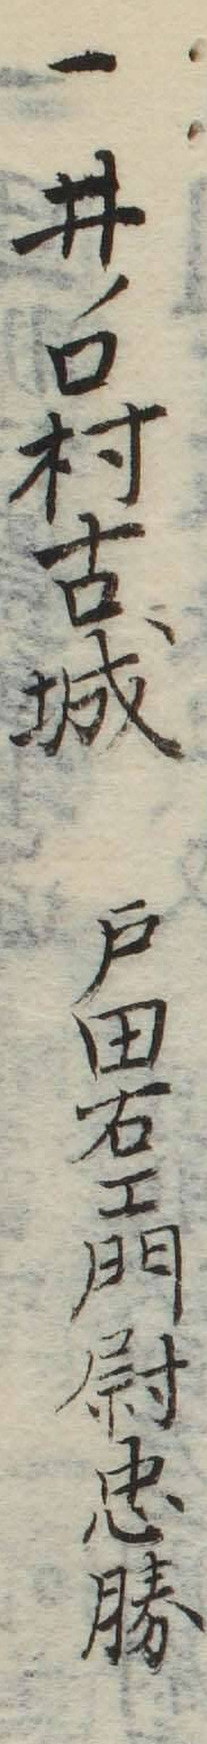一井ノ口村古城戸田右エ門尉忠勝

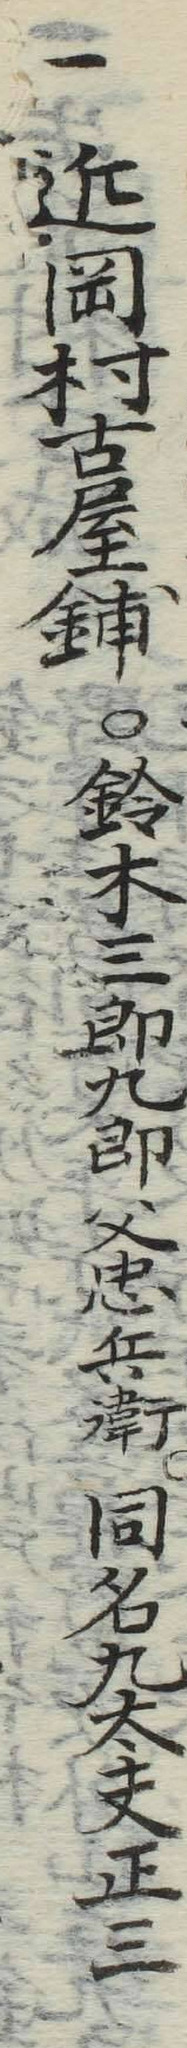一近岡村古屋鋪○鈴木三郎九郎父忠兵衛○同名九太夫正三
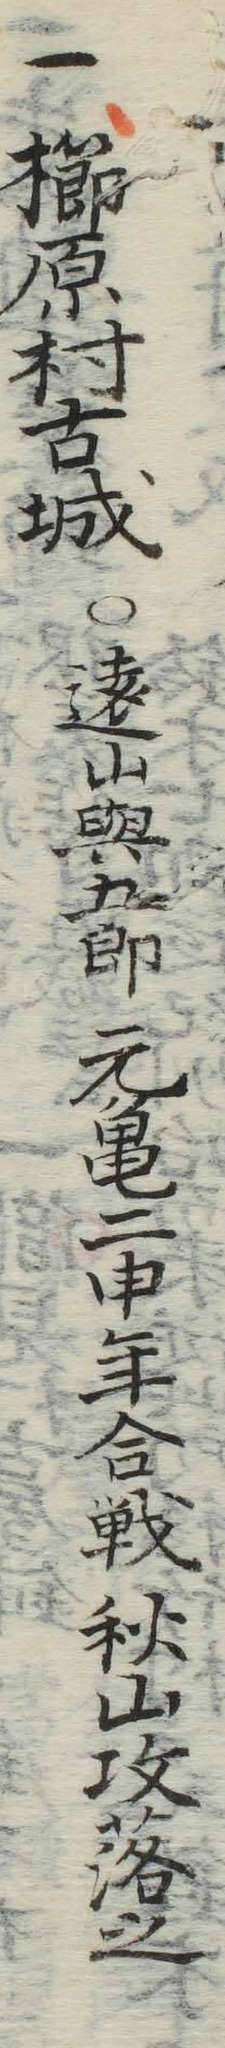一櫛原村古城○遠山與五郎元亀二申年合戦秋山攻落之
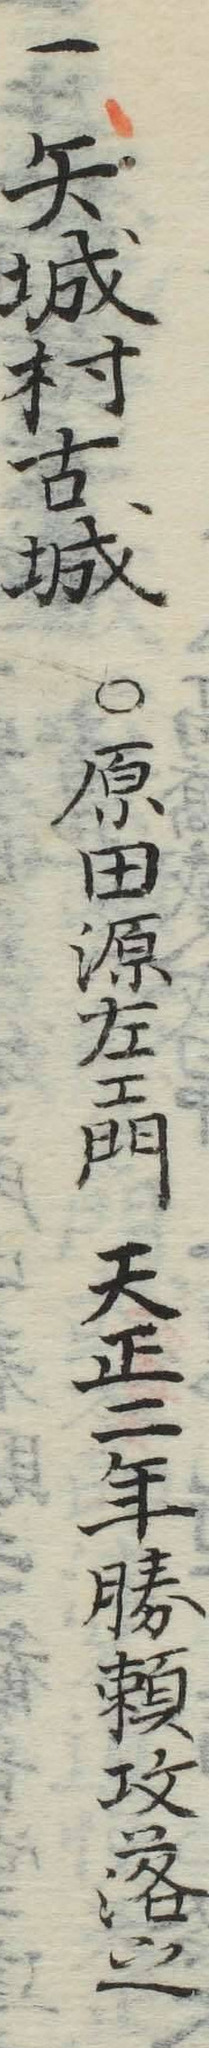一矢城村古城○原田源左エ門天正二年勝頼攻落之
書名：三河国二葉松
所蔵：国文学研究資料館
